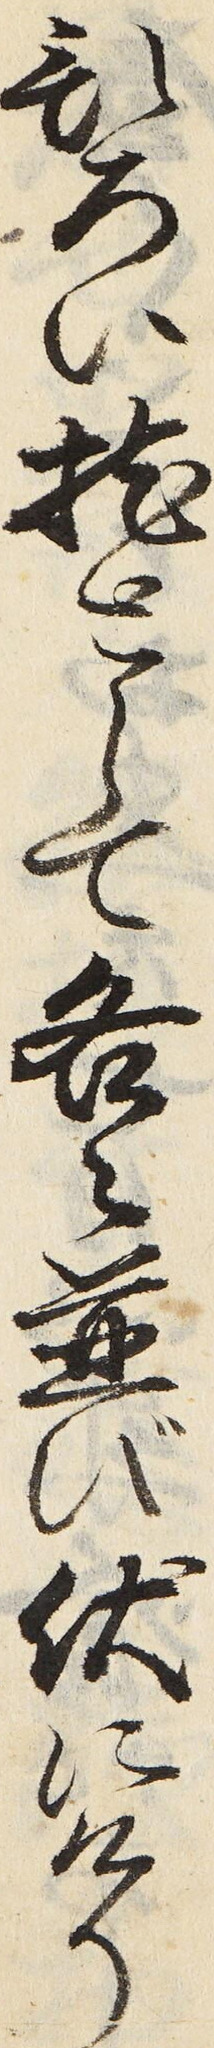ひろい扶として各々並び伏にけり
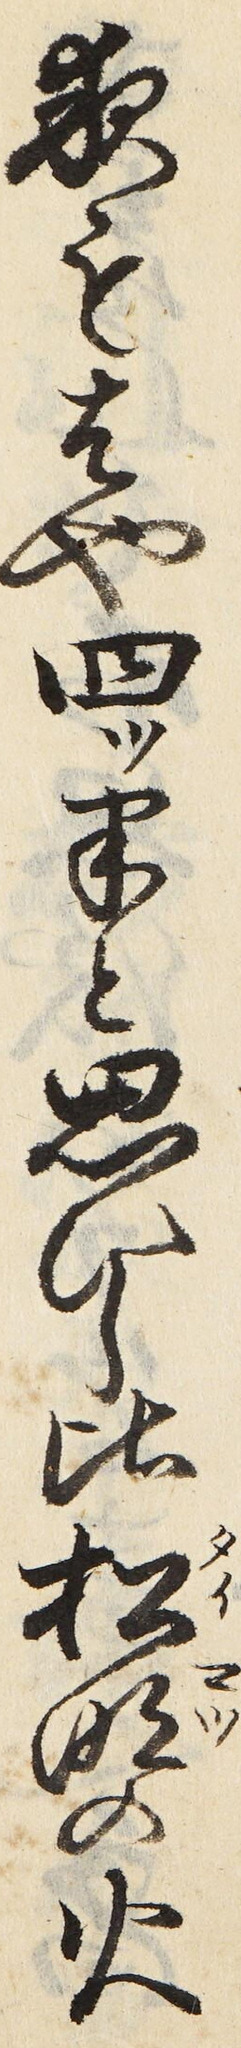夜もはや四ツ半と思ひし比松明の火
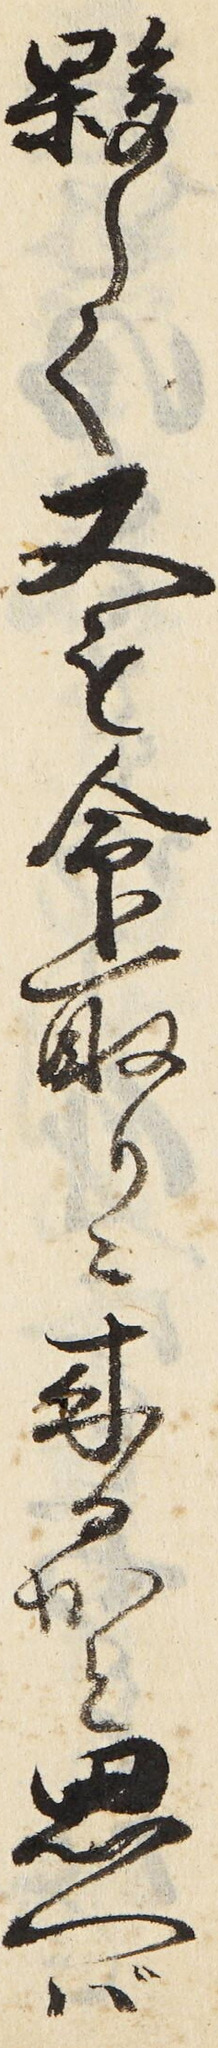夥しく又も命取りに来るかと思へば
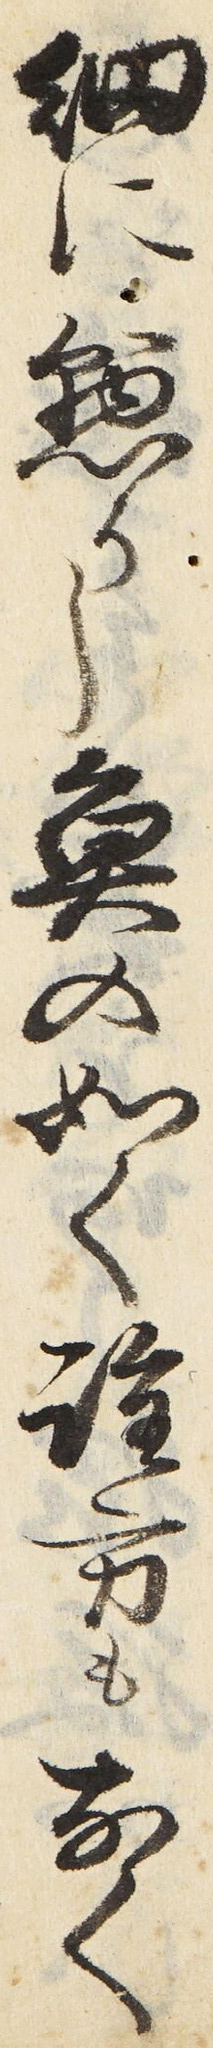網に懸りし魚の如く詮方もなく
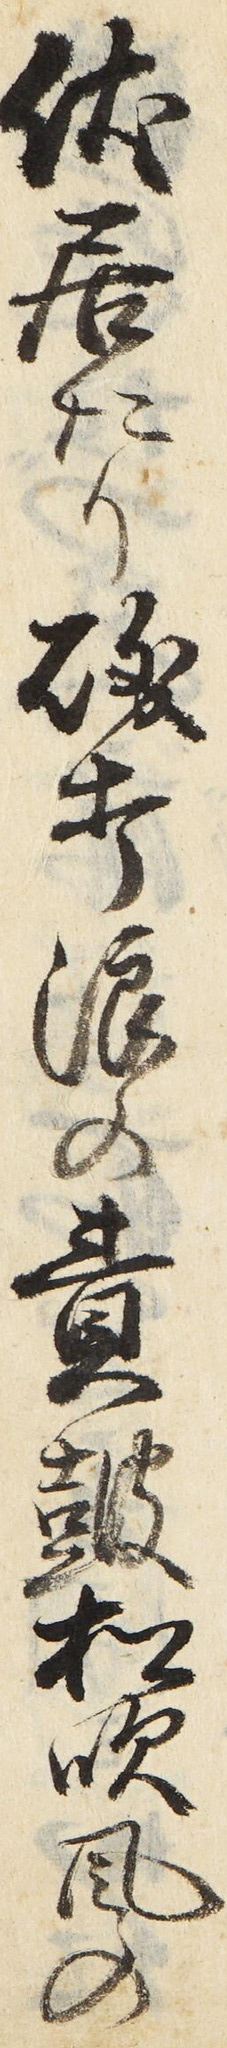伏居たり磯打浪の責鼓松吹風の
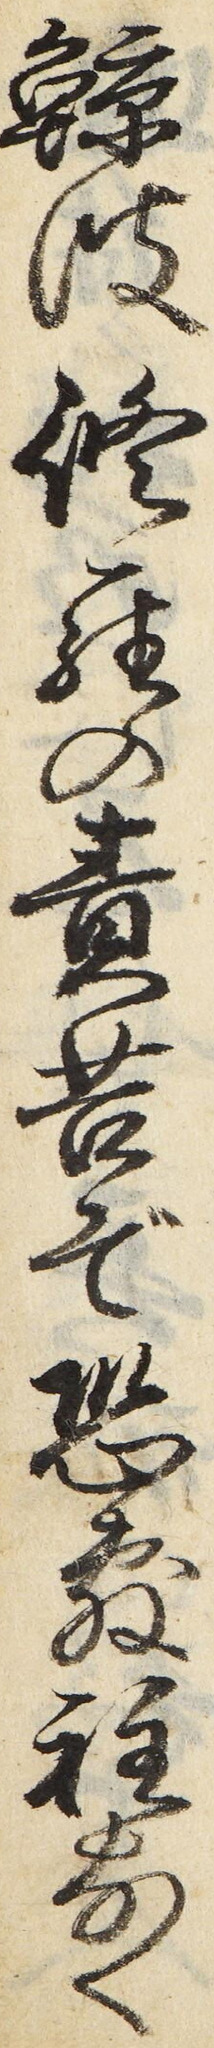鯨波修羅の責苦ぞ恐敷程なく

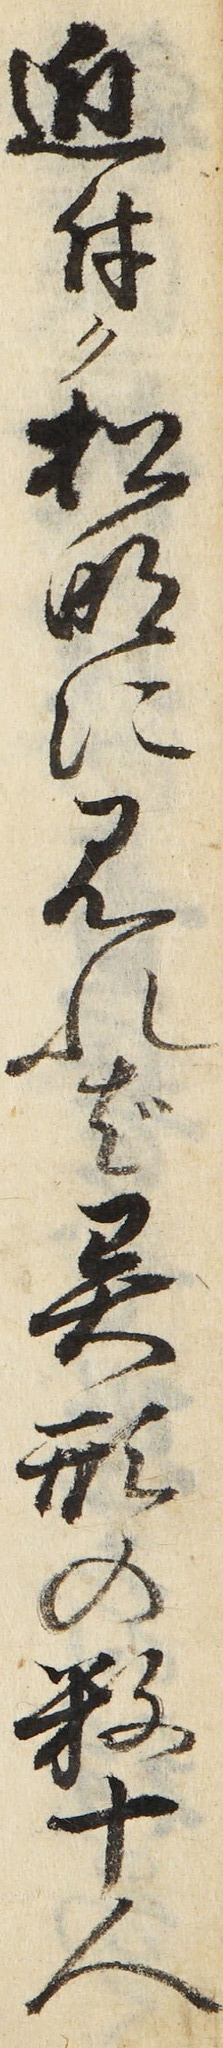近付く松明に見れば異形の数十人
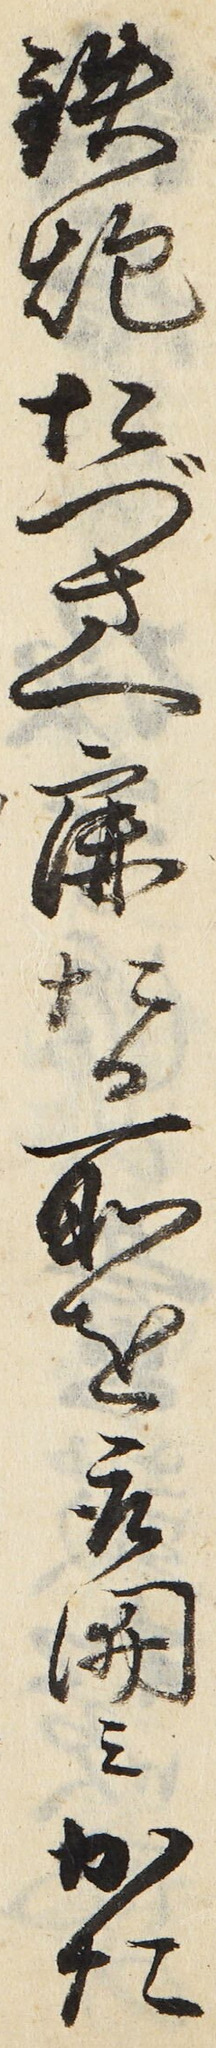鉄砲たづさへ寝たる所を取囲みかた
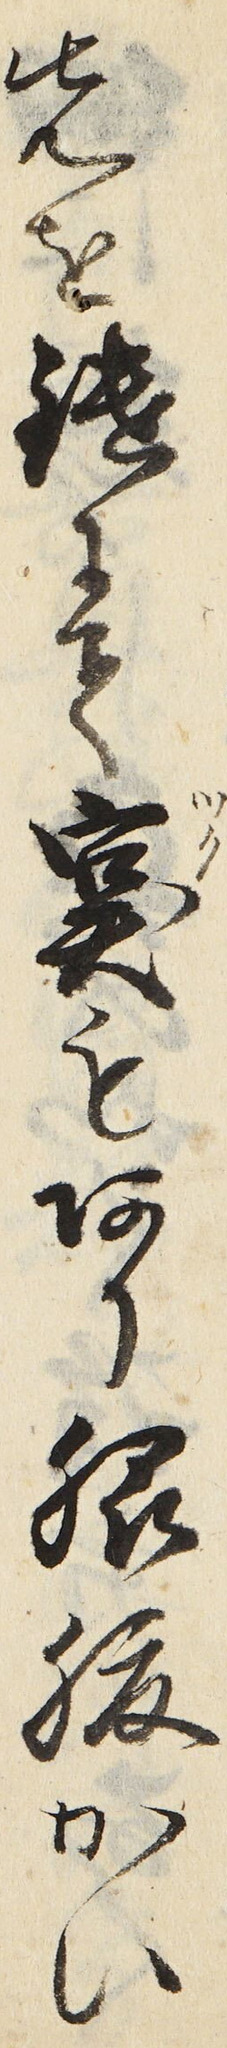先を鑓にて突もあり脇腹かい
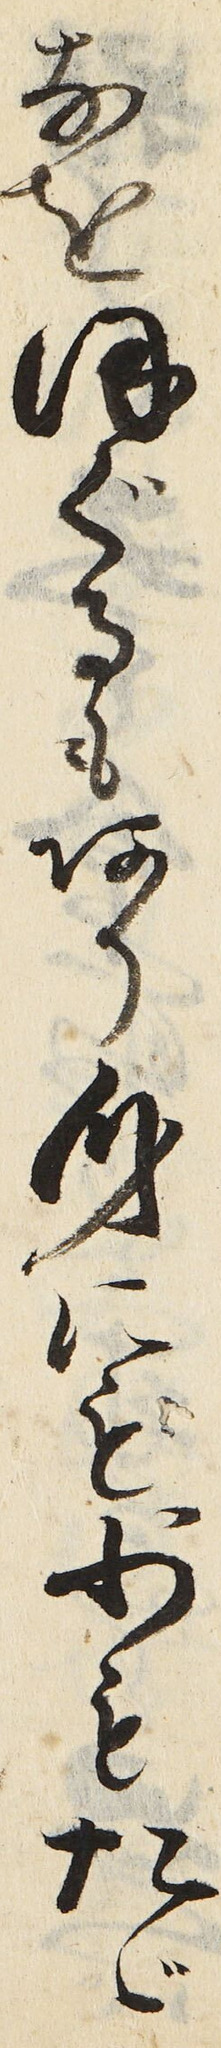なをほぐるもあり身にも少もたゞ
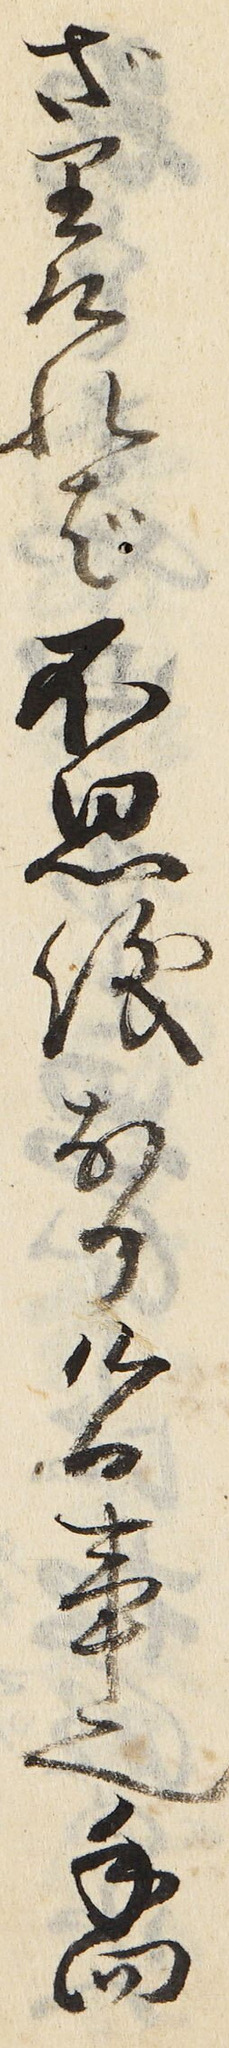ざりければ不思議なりける事也手向
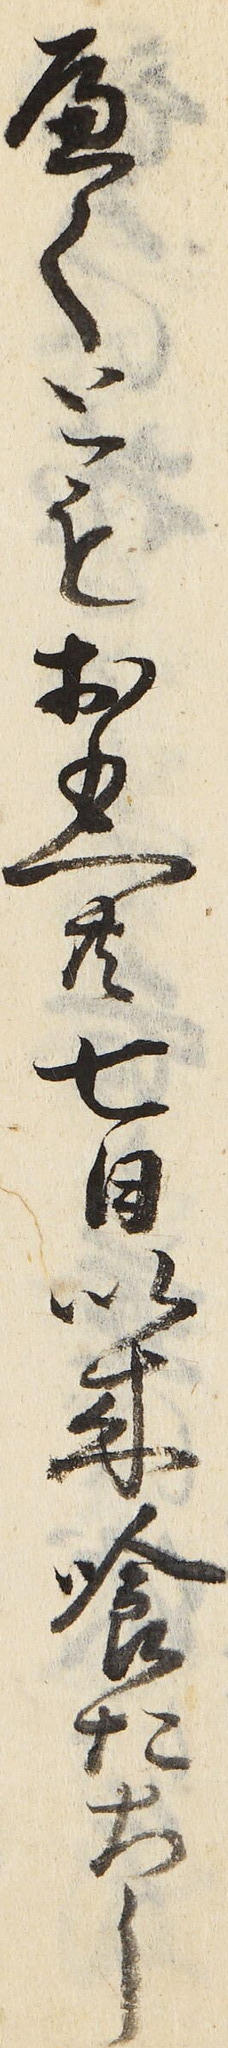へくともおもへ共七日以来喰たちし
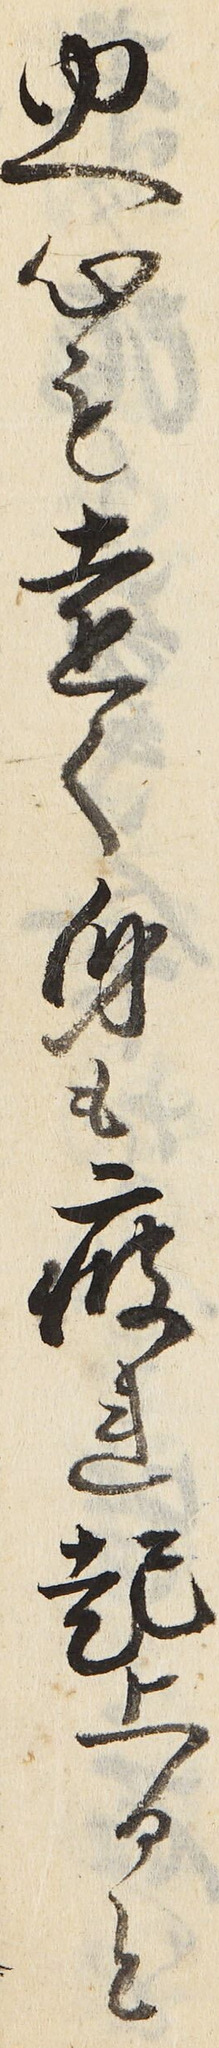ゆへ心も遠く身も疲れ起上ると
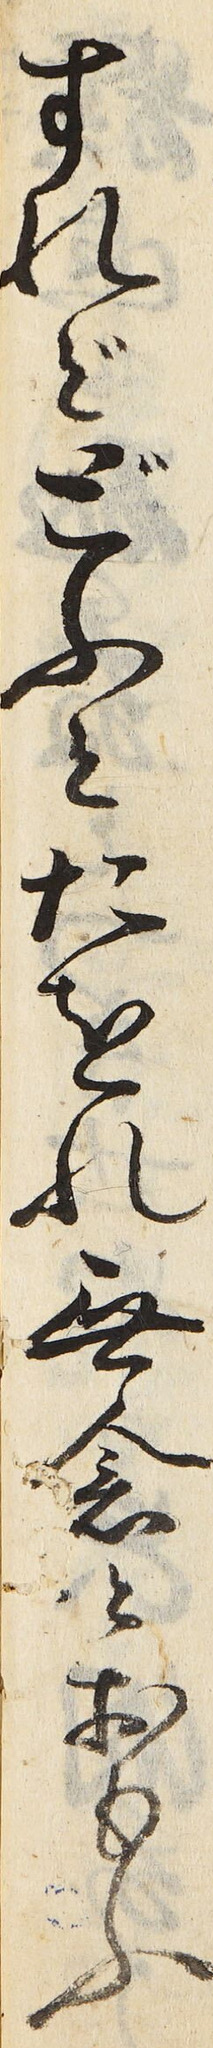すれどどふとたをれ無念とおもふ
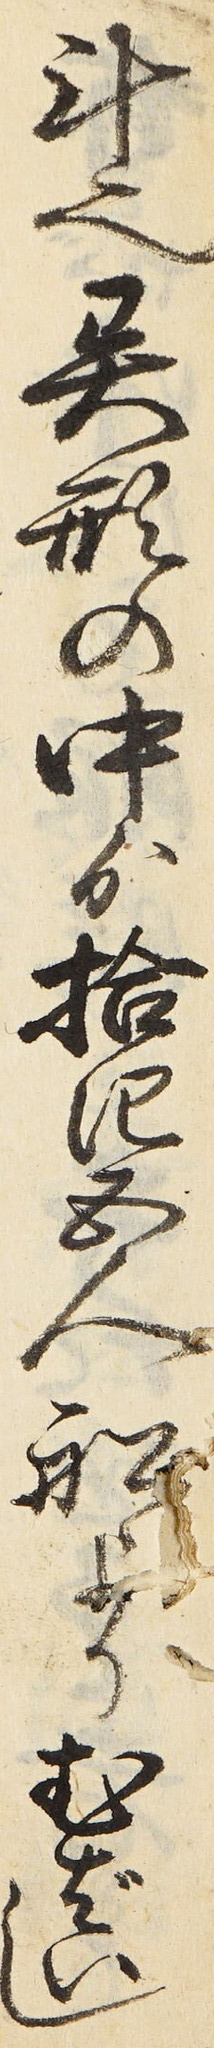計也異形の中ゟ拾四五人船よりむばいし
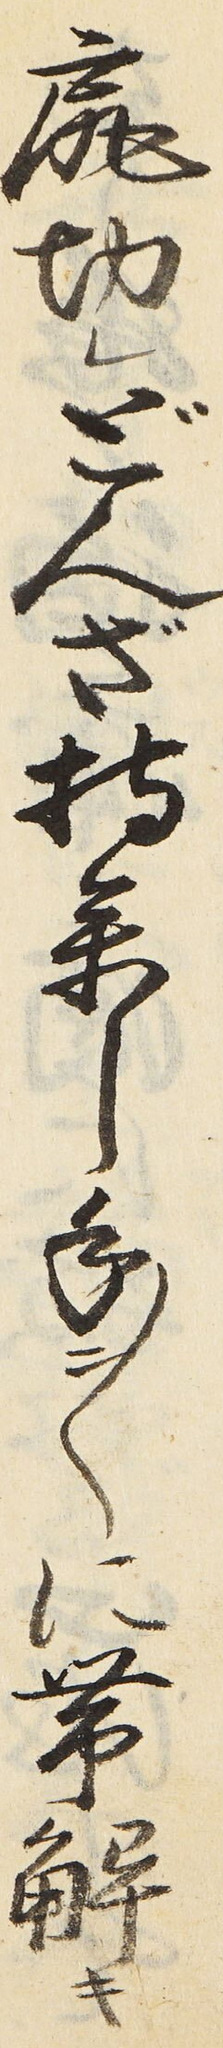尻切れどんざ持参し手に〳〵帯解き
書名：華夷九年録
